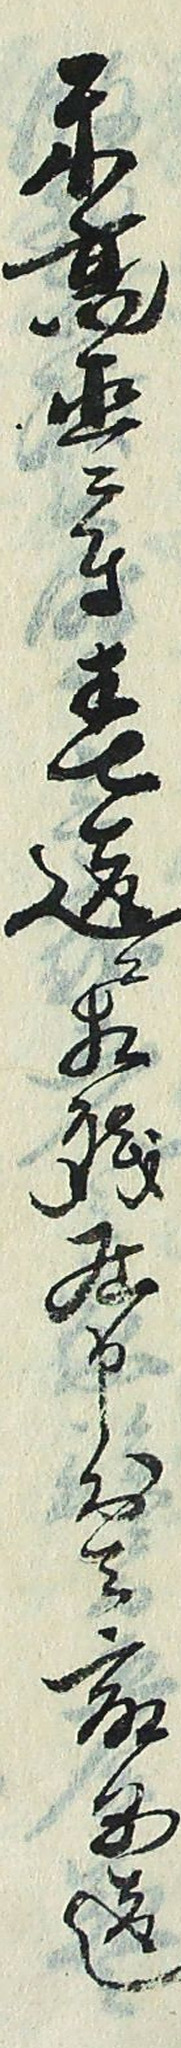米高直ニ付春造ニ相残居申分者最早造
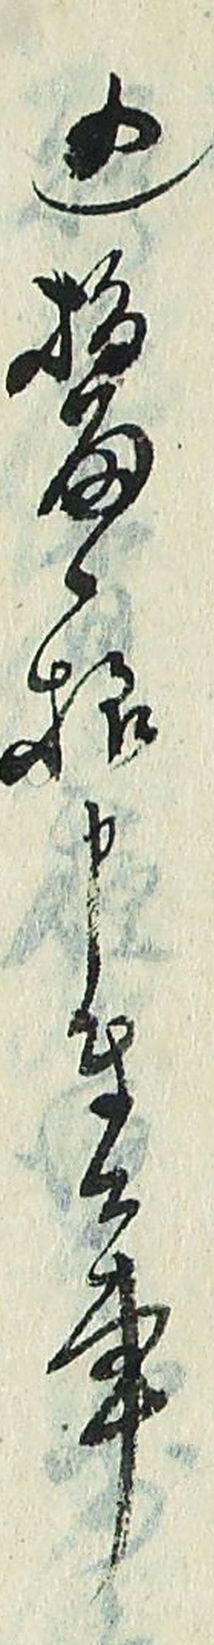込指留候様申付候事

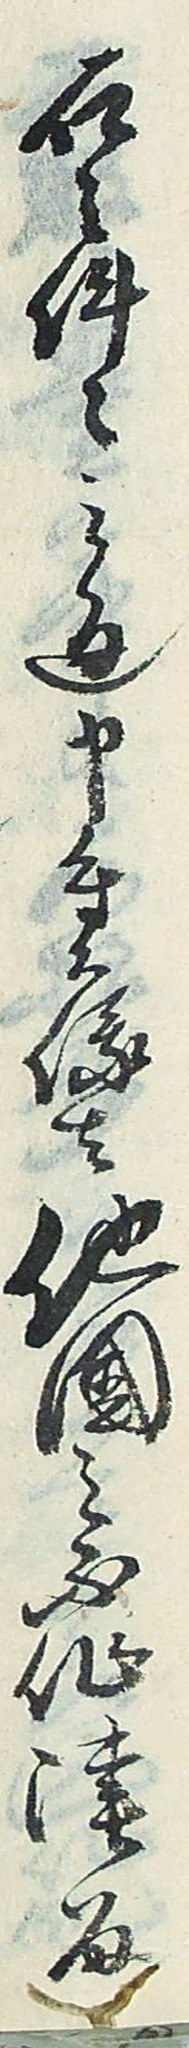右之件々之通申付候儀者他國之不作津留
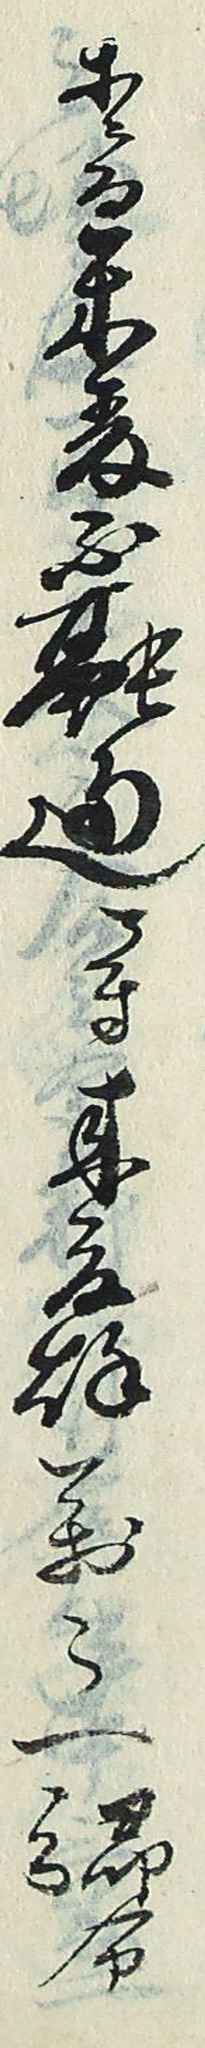等ニ而米麦不融通ニ付来夏秋萬々一郷分
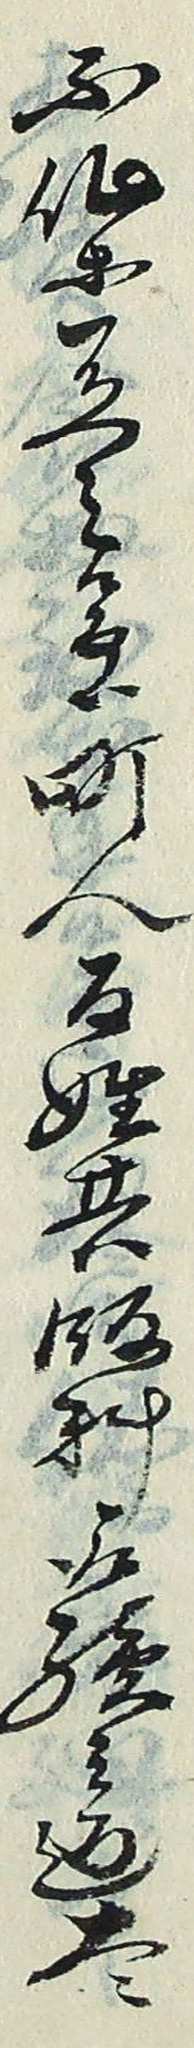不作等有之候而ハ町人百姓共飯料取續之道大ニ
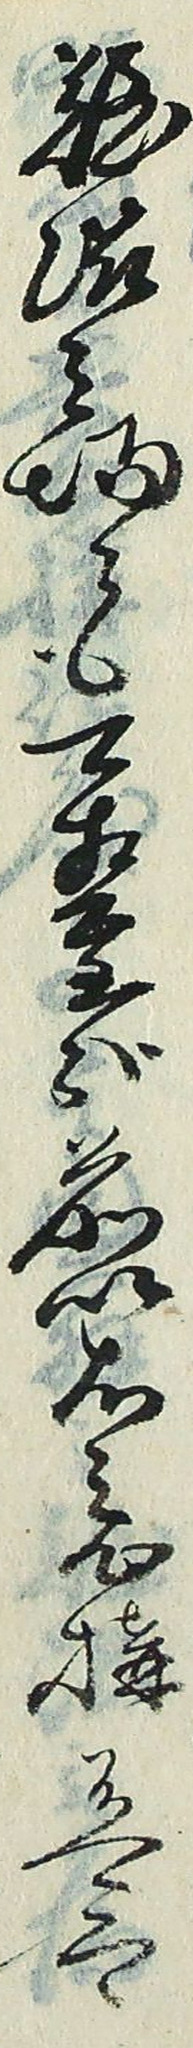難渋之場ニも可相至哉前以右之心構有之候ハヽ
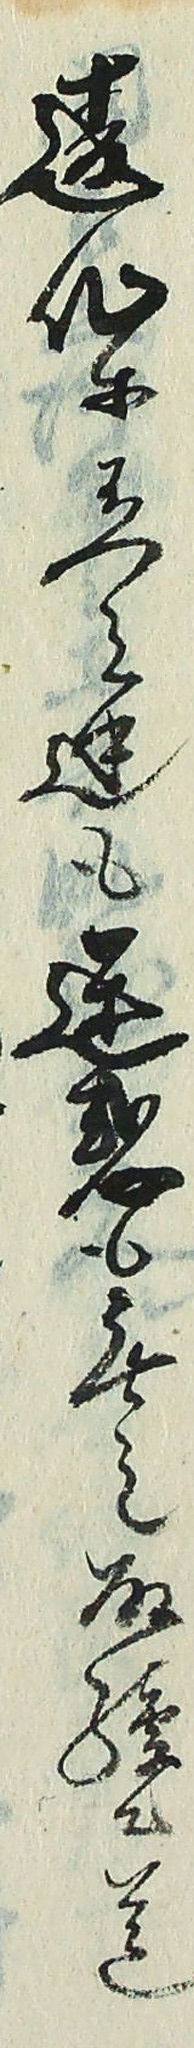違作等有之迚も迷惑も無之取續候道
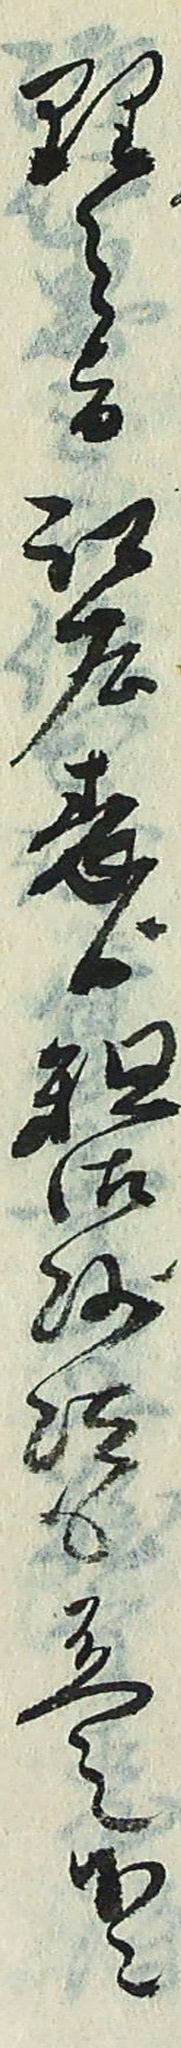理之旨江戸表ゟ粗御沙汰も有之下々
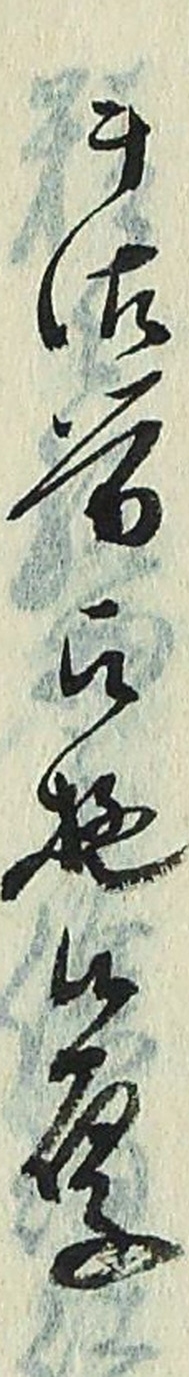ヲ御労被遊候厚
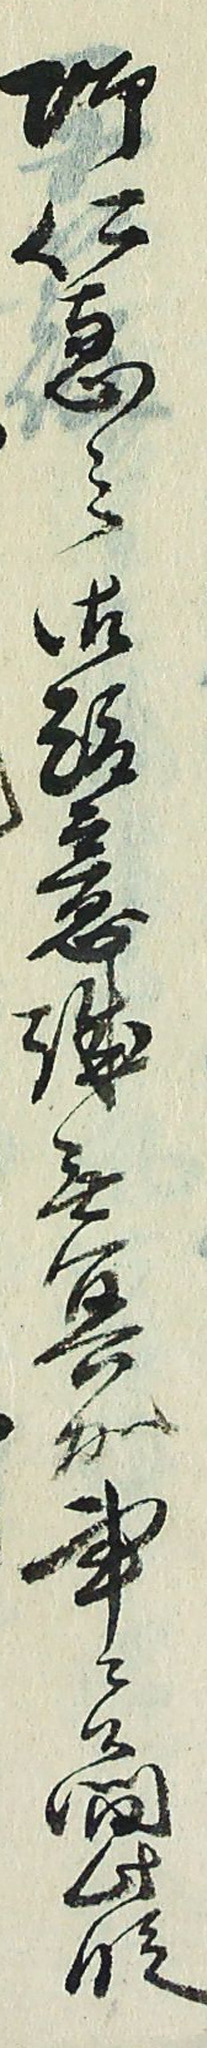御仁恵之御趣意誠無冥加事ニ候間此段
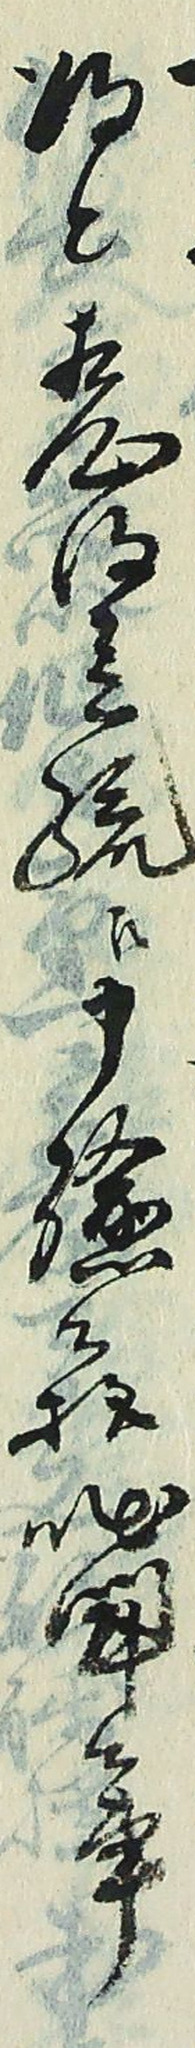得と相心得壱統江申諭候様咄聞候事
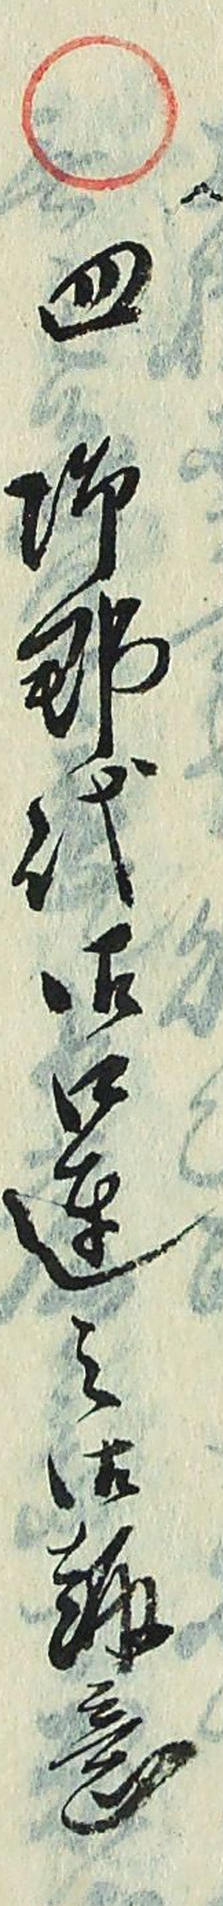○四御郡代御口達之御趣意
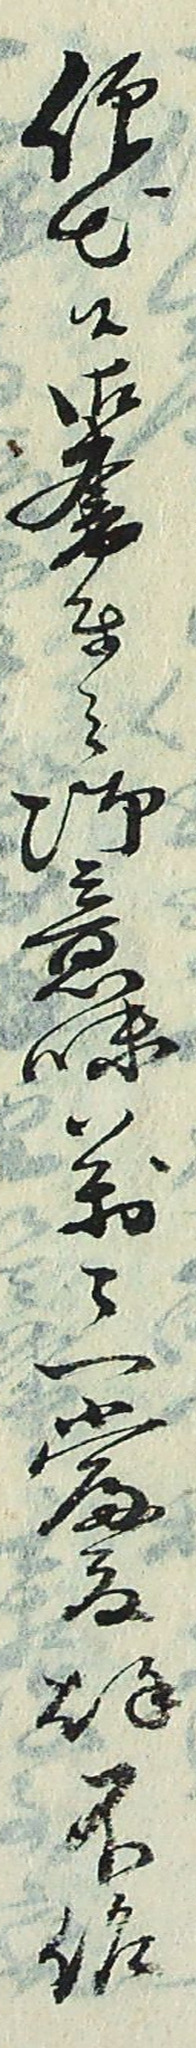仰出候御書付之御意味萬々一當夏秋不作
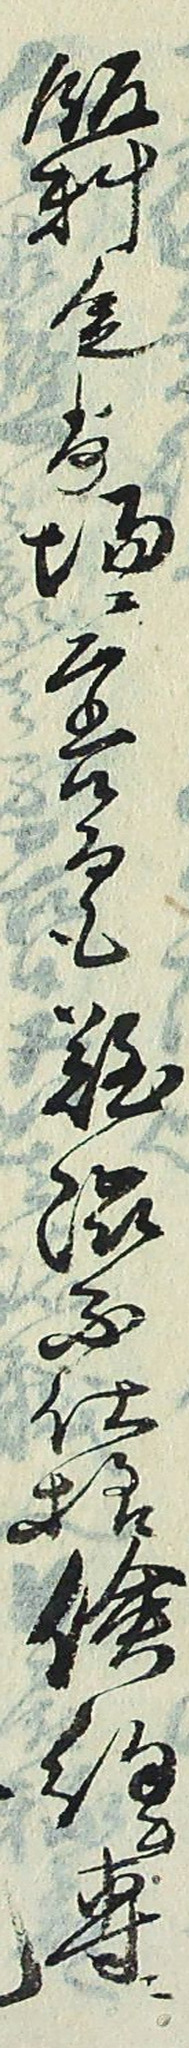飯料乏布場ニ至候而も難渋不仕様倹約ヲ専ニ
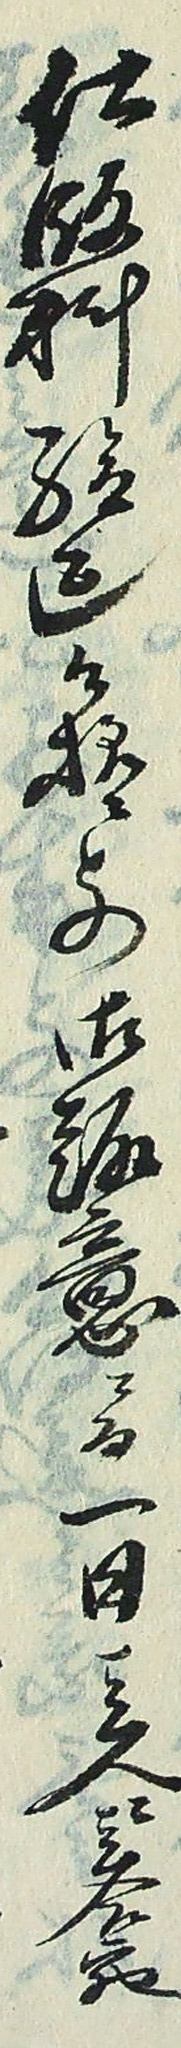仕飯料給延候様ニとの御趣意ニ而一日壱人ニ壱合宛
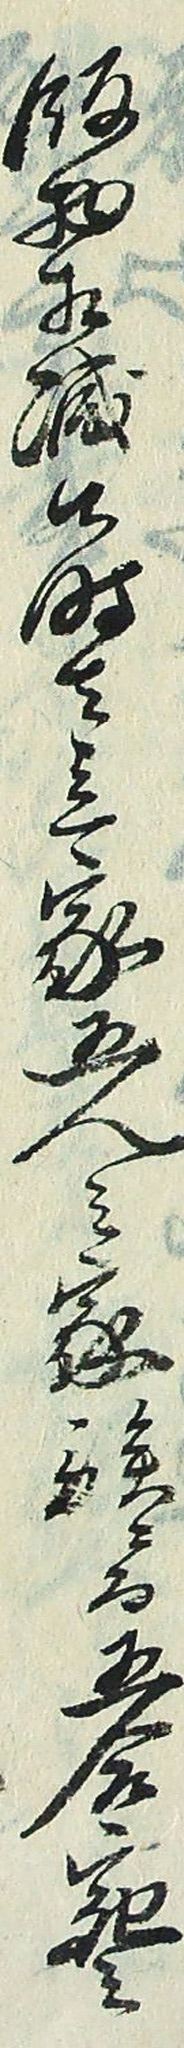飯物相減候時者壱家五人之家族ニ而五合宛之
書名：諸御趣意書并御下知向之写
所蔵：鳴門教育大学 Naruto University of Education
